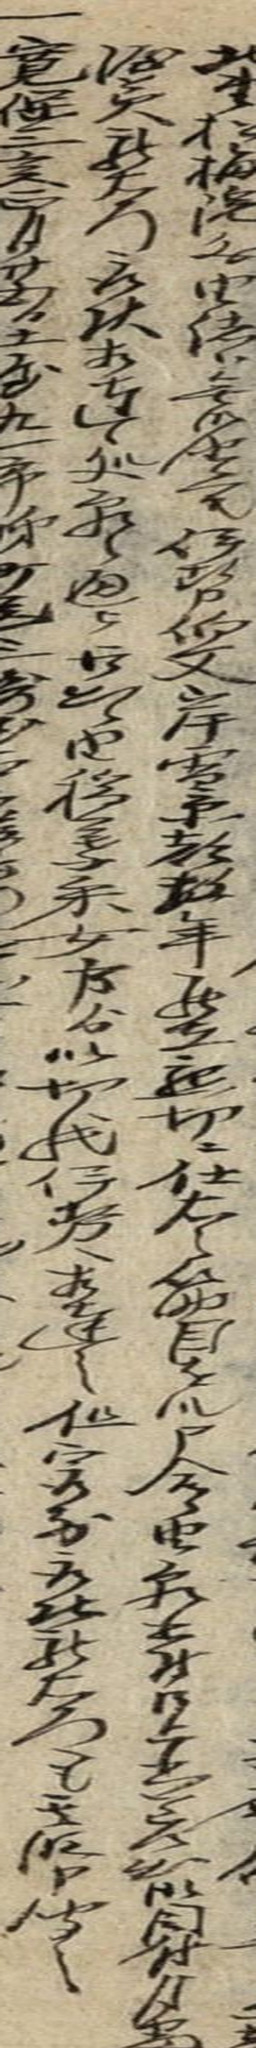渥美新右衛門取次相達候処願之通被仰出候由稲葉采女方ゟ以切紙伊勢へ相達之但最前取次新右衛門へも其段申聞之

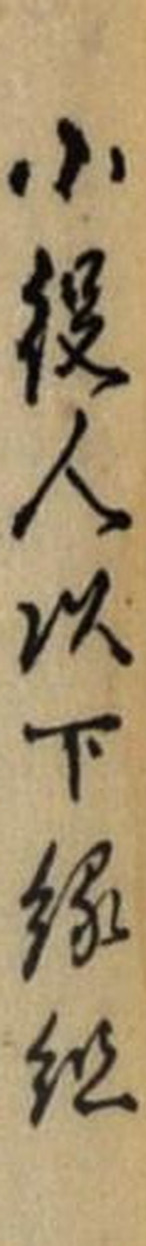小役人以下縁組
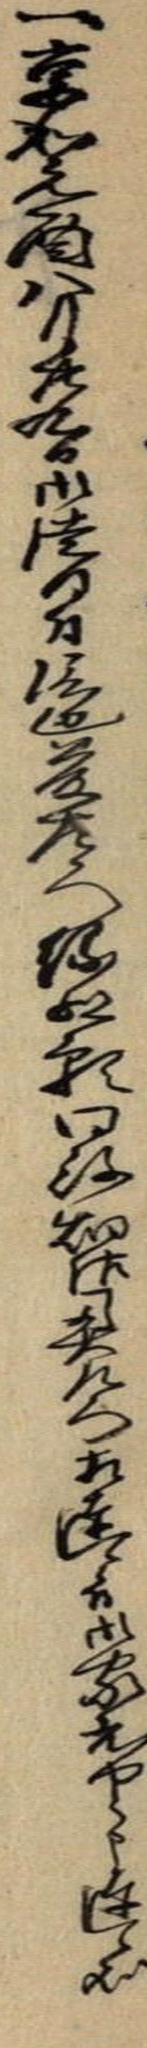一享和元酉八月廿九日御徒目付渡辺藤左衛門縁組願同役畑佐奥左衛門相達候ニ付御家老中へ申達候処
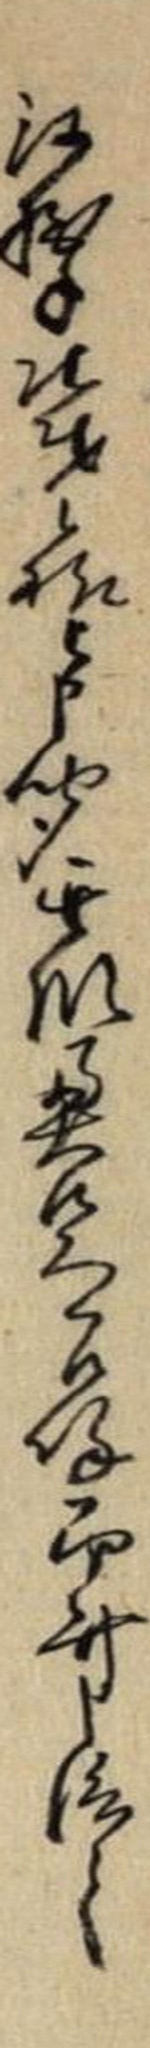致勝手次第候様被申聞其段奥左衛門召呼即刻申渡之
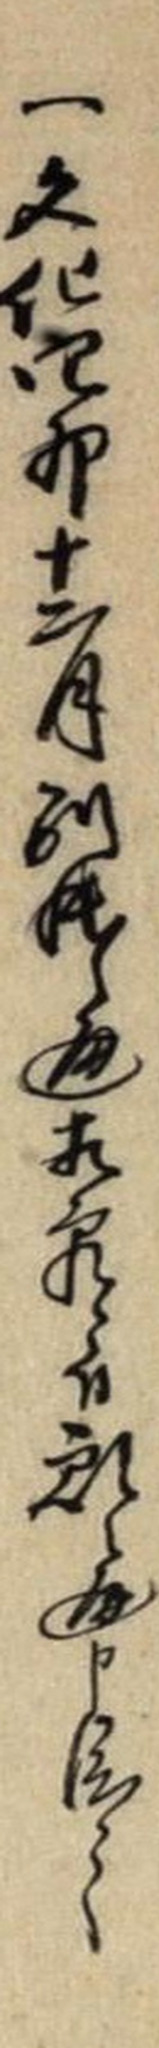一文化四卯十二月別紙之通相願候ニ付願之通申渡之
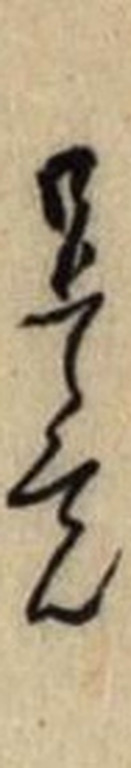口上之覚
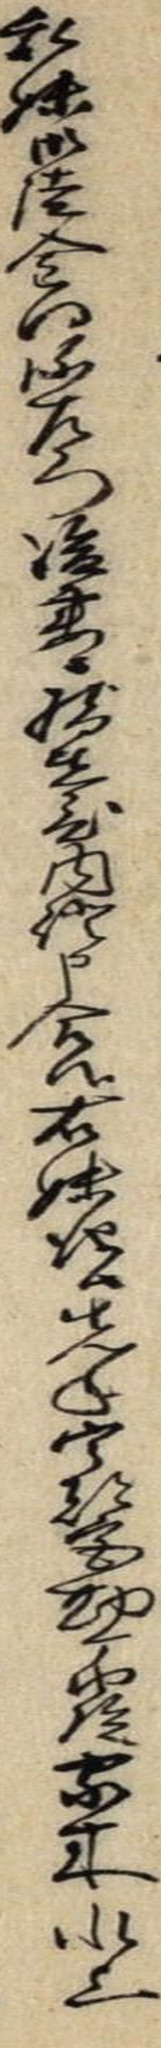私妹御徒金田弥左衛門後妻指遣度内証申合候右妹儀ハ先年宇都宮勘ケ由殿家来水上
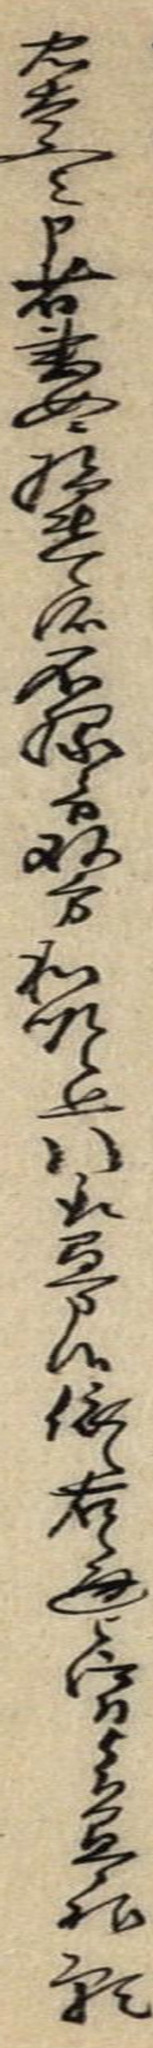忠大夫と申者妻女ニ指遣候所不縁ニ付双方和順之上引取置申候依之右之通被仰付被下置候様願
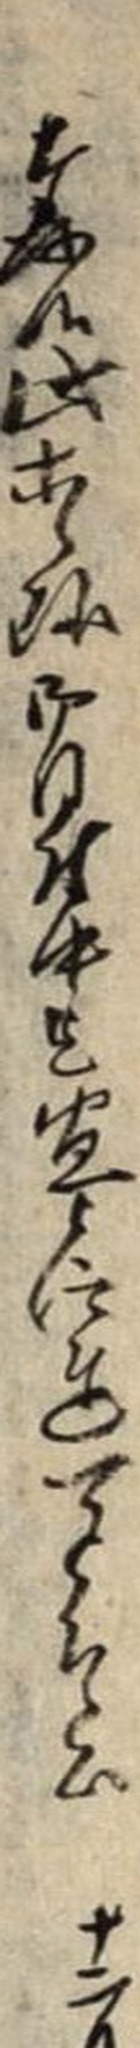奉存候此等之趣御目付中迄宜被仰達可被下候以上十二月
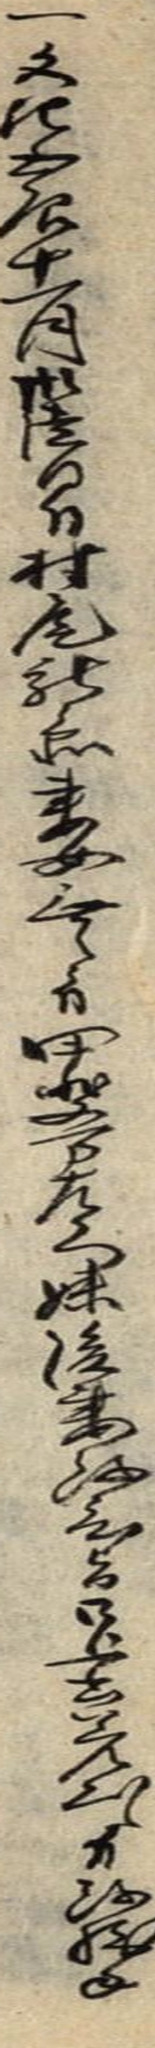一文化五辰十一月御徒目付村尾新兵衛妻女無之ニ付甲斐万左衛門妹後妻致度旨口上書差出候ニ付致勝手
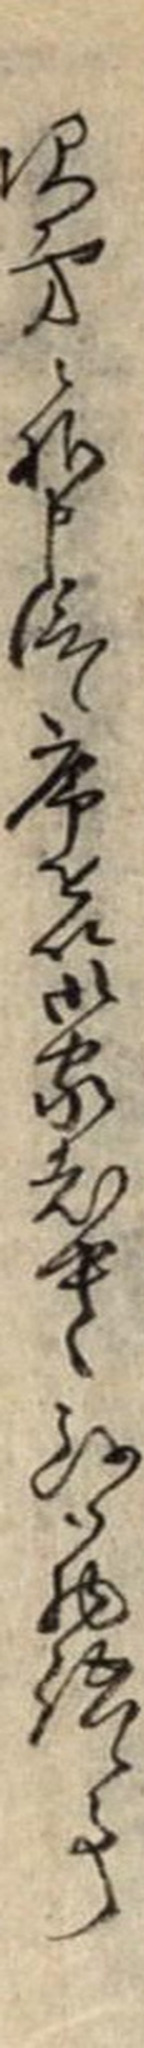次第ニ候様申渡候序を以御家老中へ致御物語候事
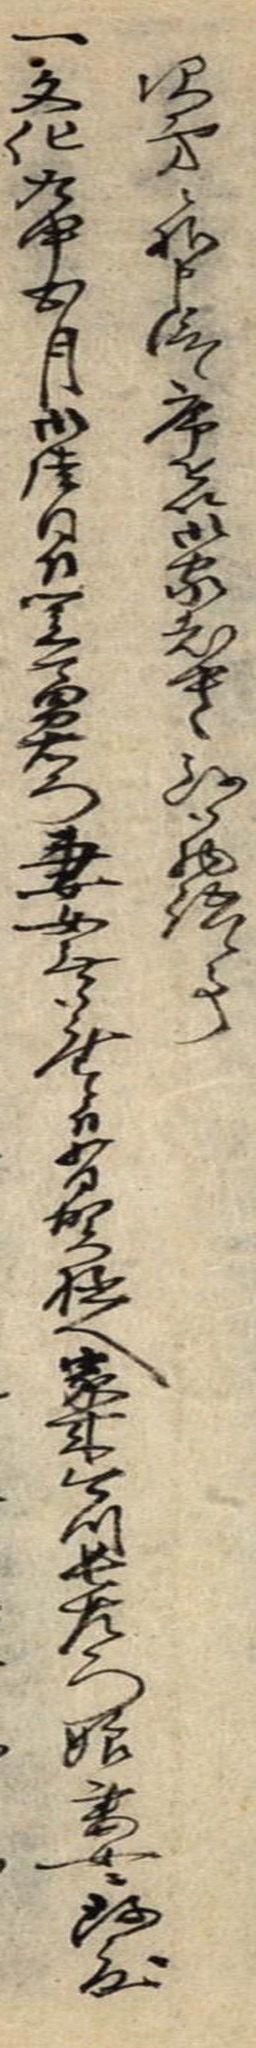一文化九申五月御徒目付関勇右衛門妻女無御座候ニ付有賀極人家来今川長左衛門娘妻女ニ致度
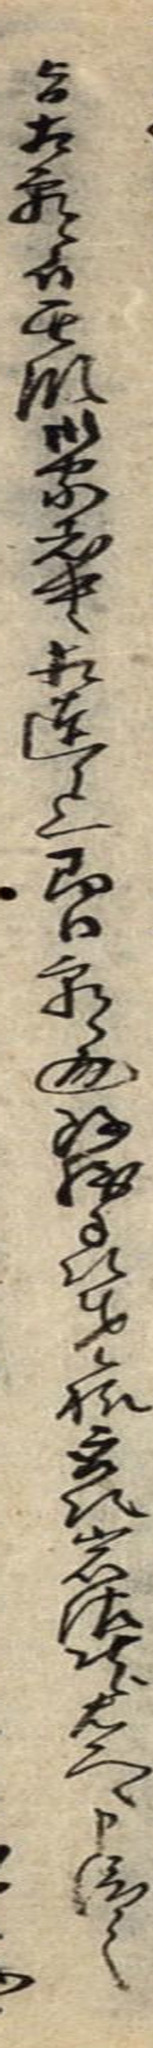旨相願候ニ付其段御家老中へ相達候上即日願之通致勝手次第候様取次岩佐次郎右衛門へ申渡之
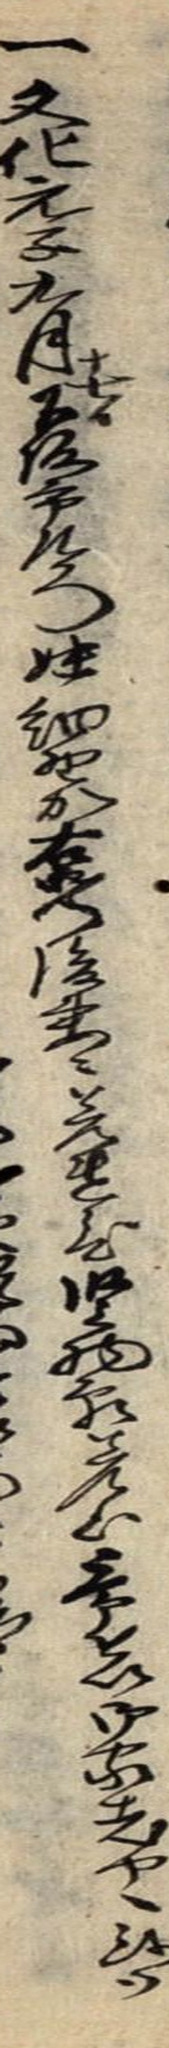一文化元子九月十七日下坂市左衛門妹細野加右衛門後妻ニ差遣度竪物願差出序を以御家老中へ致御
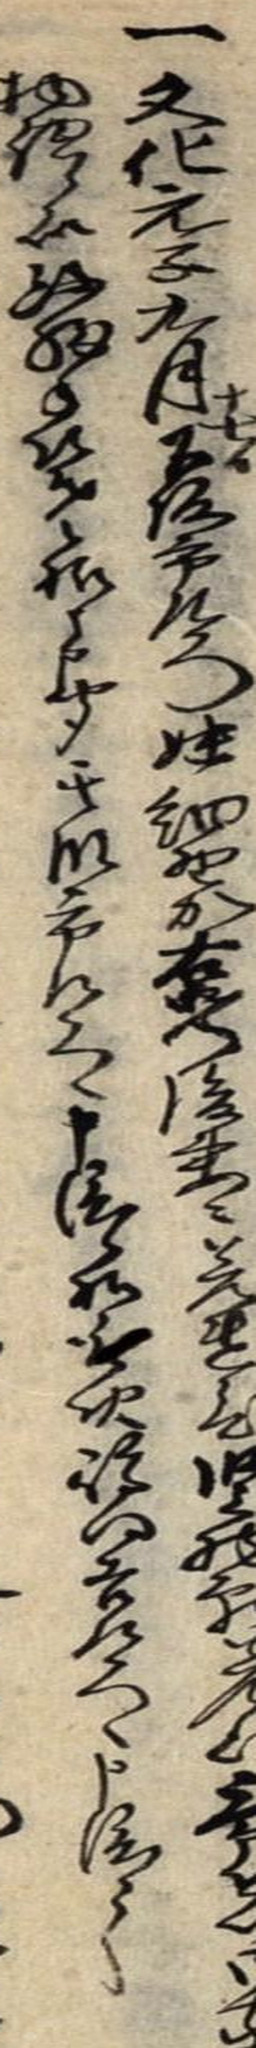物語候処致勝手次第候様被申聞其段市左衛門へ申渡候様取次嶋田吉左衛門へ申渡之
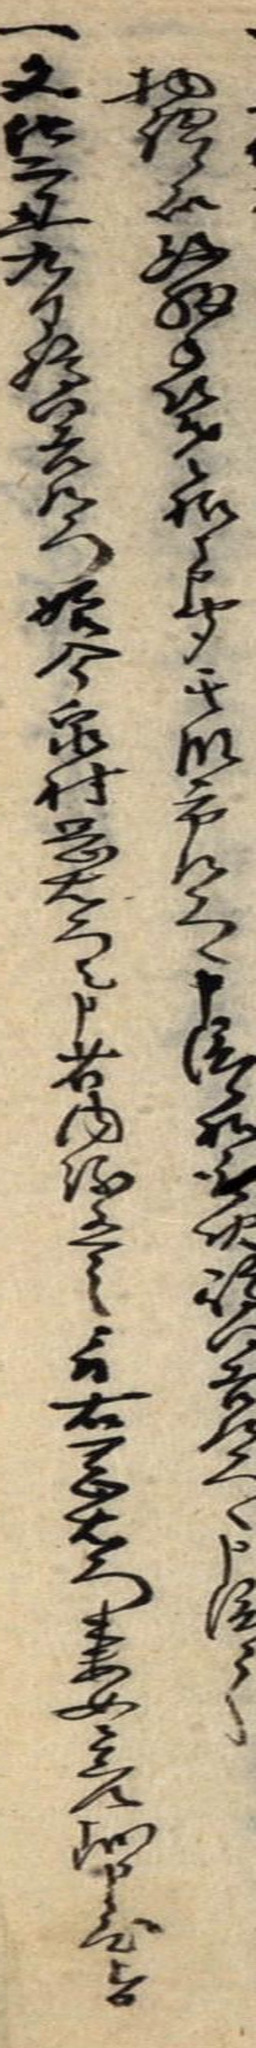一文化二丑九月嶋田吉左衛門娘今泉村岡右衛門与申者内縁有之ニ付右岡右衛門妻女ニ差越申度旨
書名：養子縁組之部
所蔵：福井県文書館 Fukui Prefectural Archives
